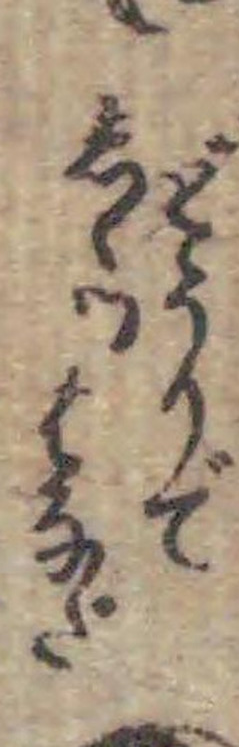しゝッはなだ
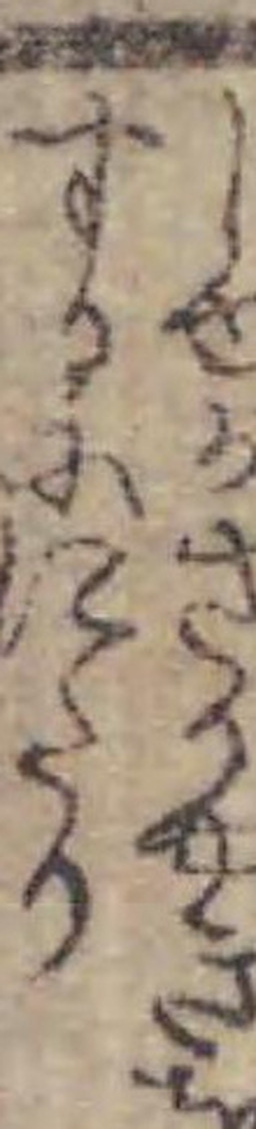するににたり
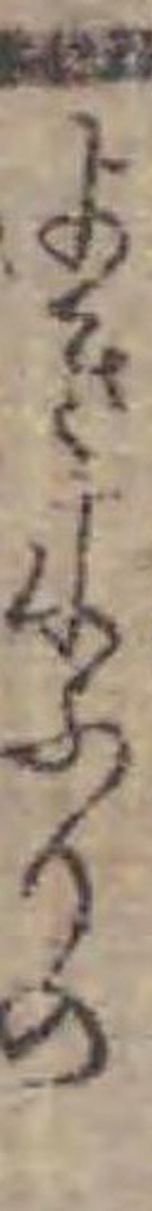よき木なりの
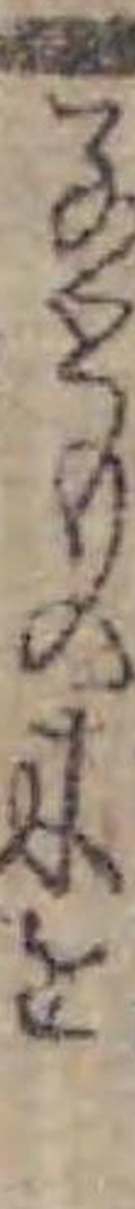子どもの木を
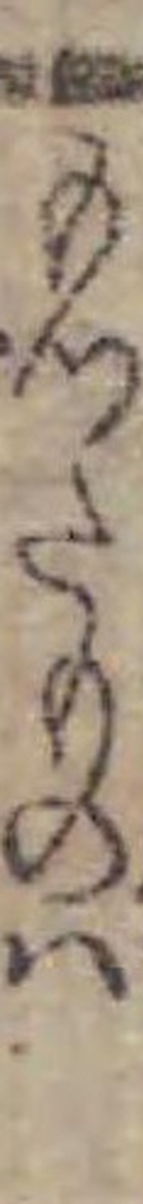もつたものは
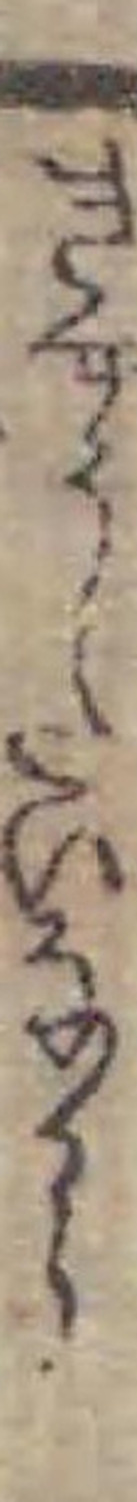きやうたいなから
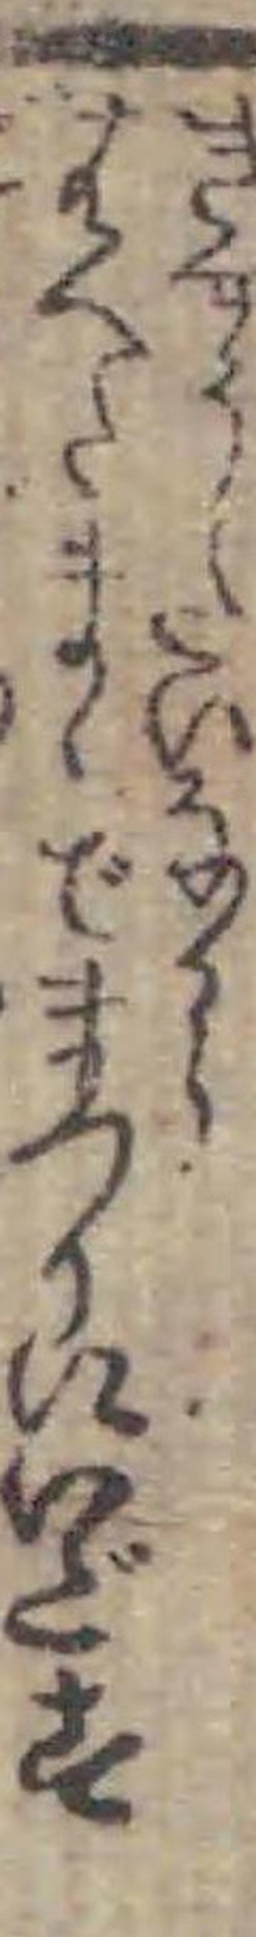はへたまゝでまつりにいだす
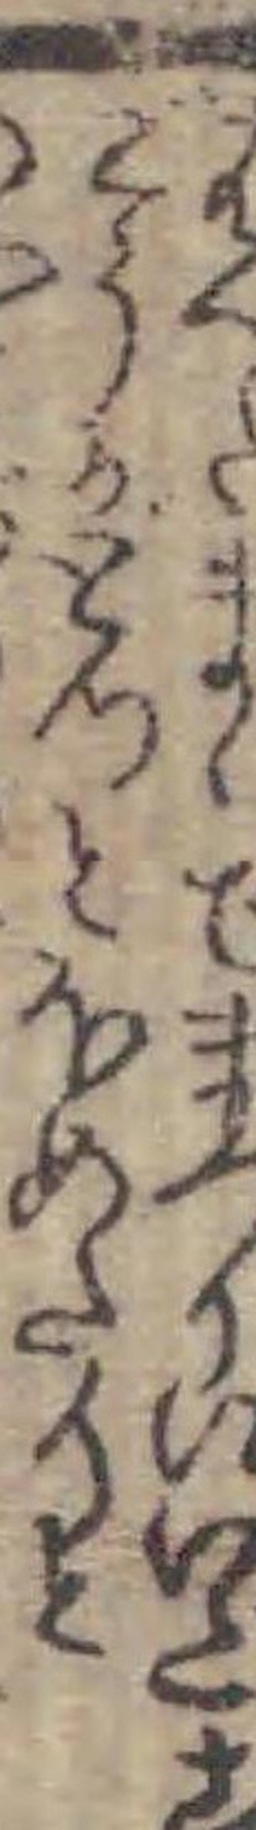どうかどつとほめたりと
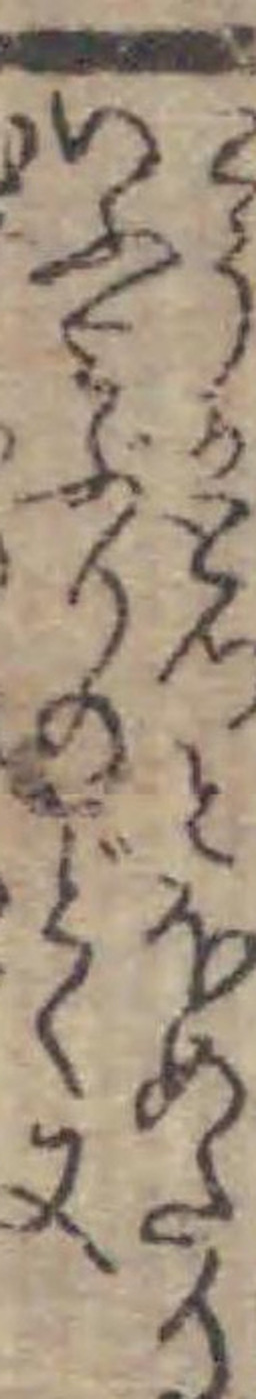いふみぶりのごとく又
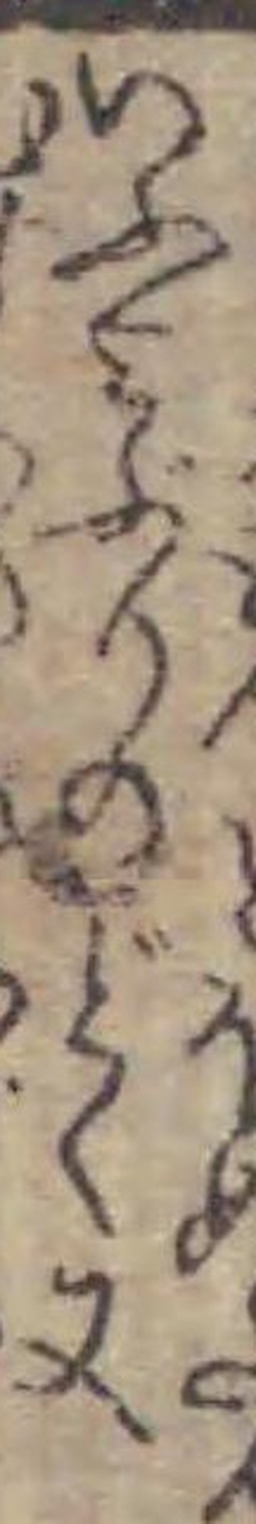いふみぶりのごとく又
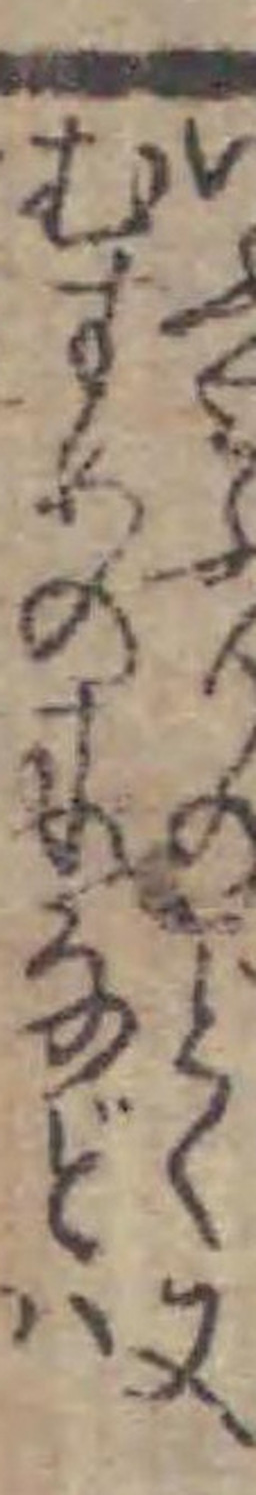むすめの木などは
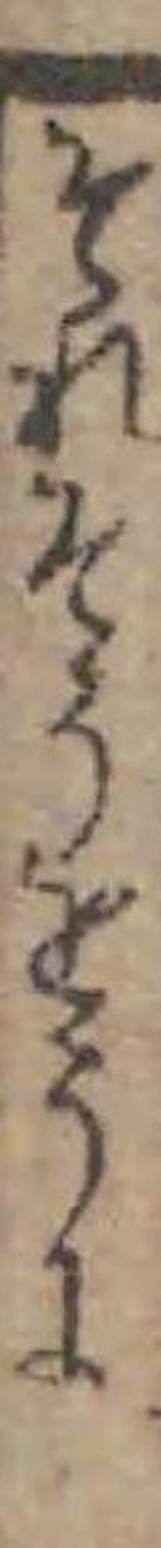それそうをうに
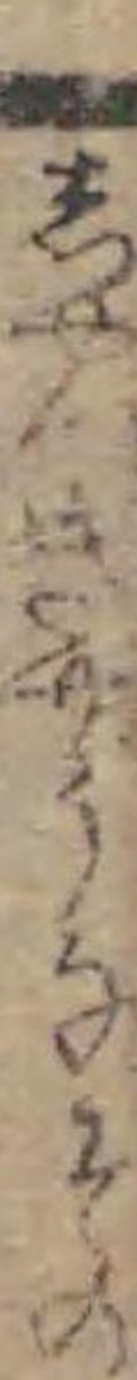しやつきやうなその
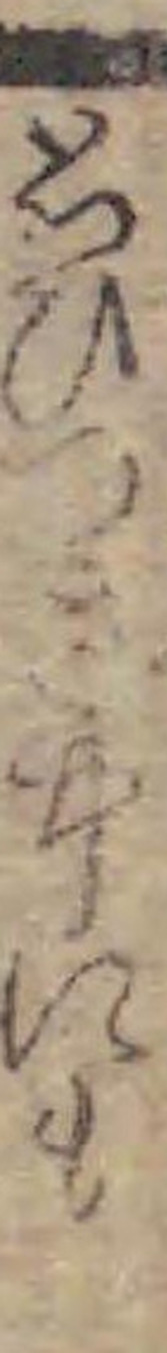思ひつき中にも
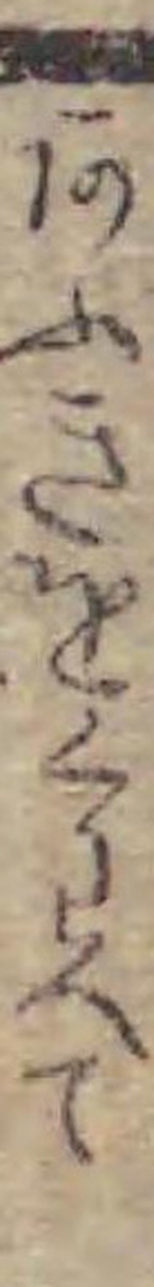あふきをくわへて
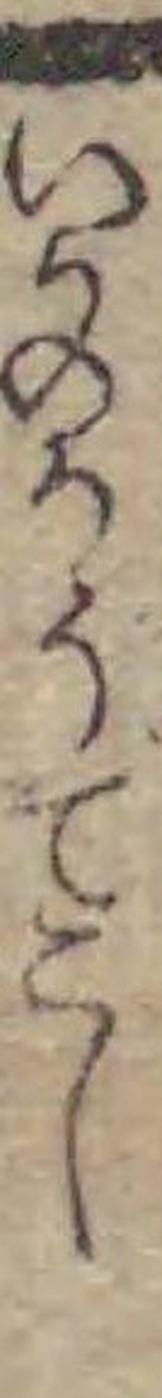いかのかうでこし
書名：奇妙頂礼胎錫杖 : 3巻
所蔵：国立国会図書館 National Diet Library, JAPAN
